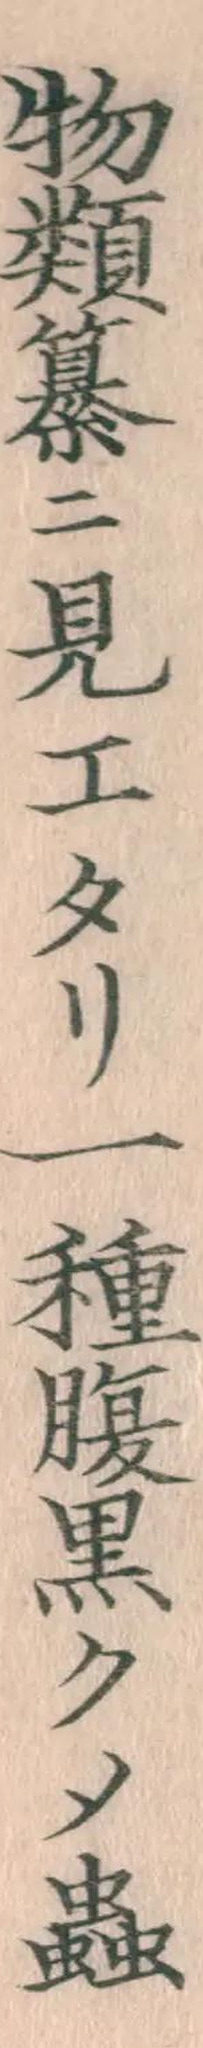物類纂ニ見エタリ一種腹黒クシテ虫
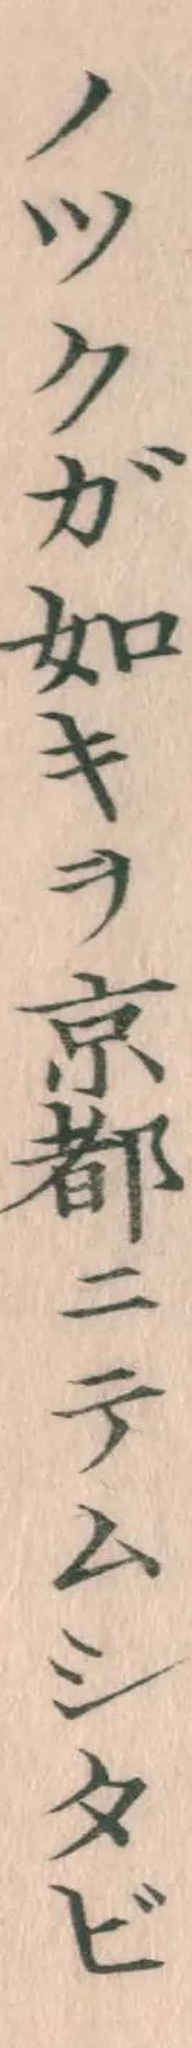ノツクガ如キヲ京都ニテムシタビ
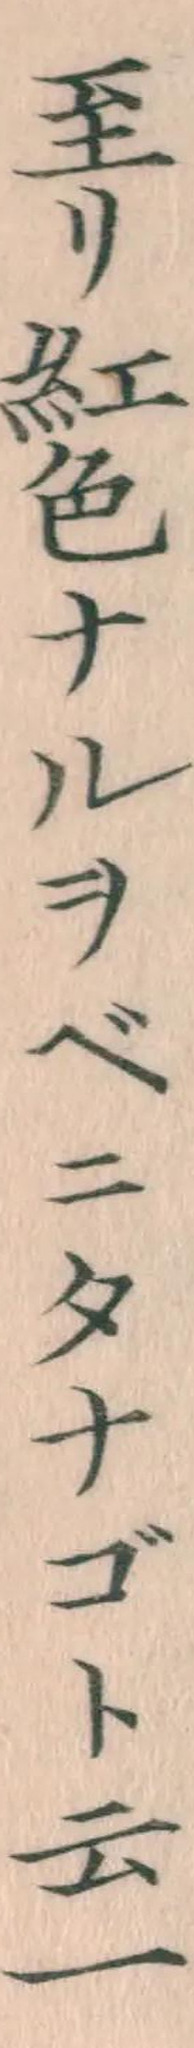至リ紅色ナルヲベニタナゴト云一
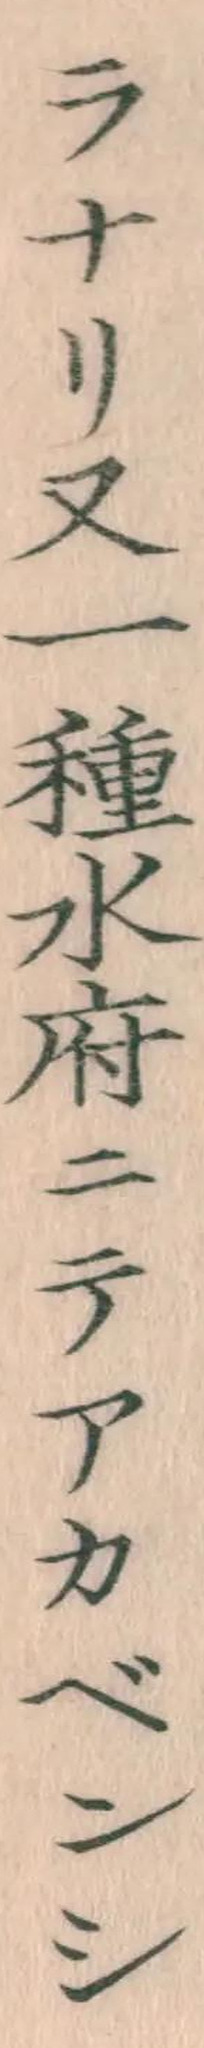ラナリ又一種水府ニテアカベンシ
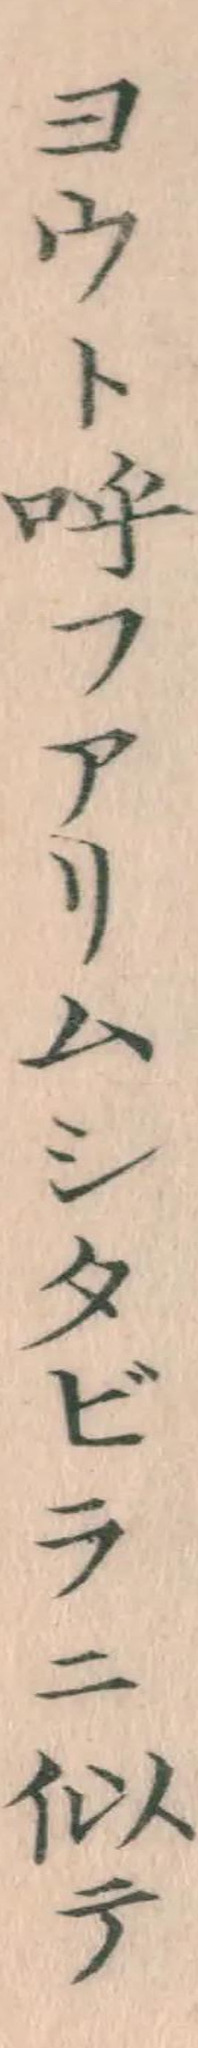ヨウト呼フアリムシタビラニ似テ
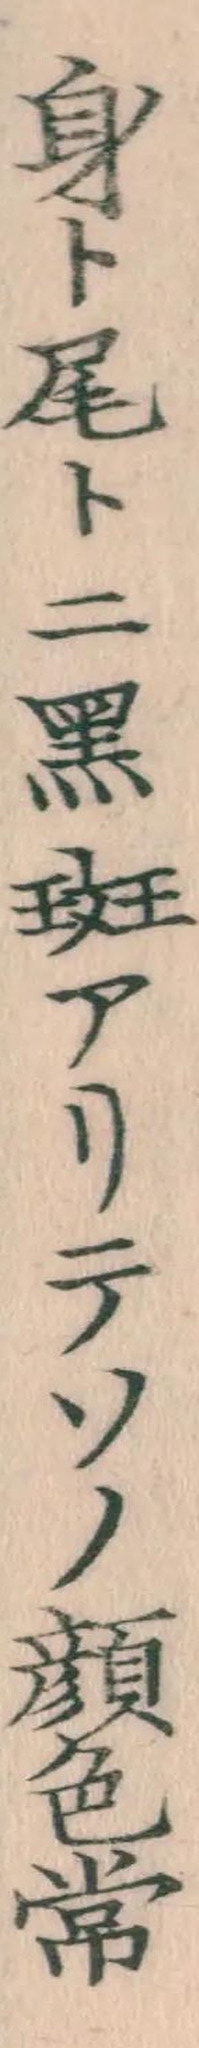身ト尾トニ黒斑アリテソノ顔色常
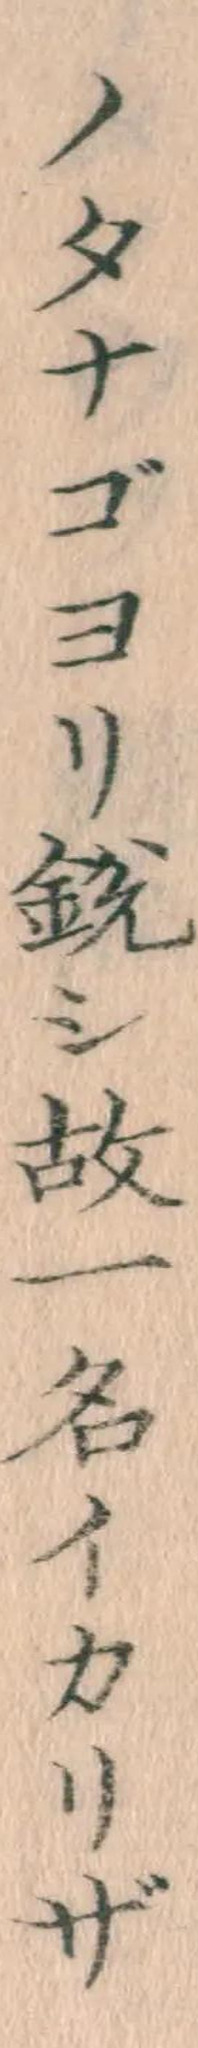ノタナゴヨリ鋭シ故一名イカリザ
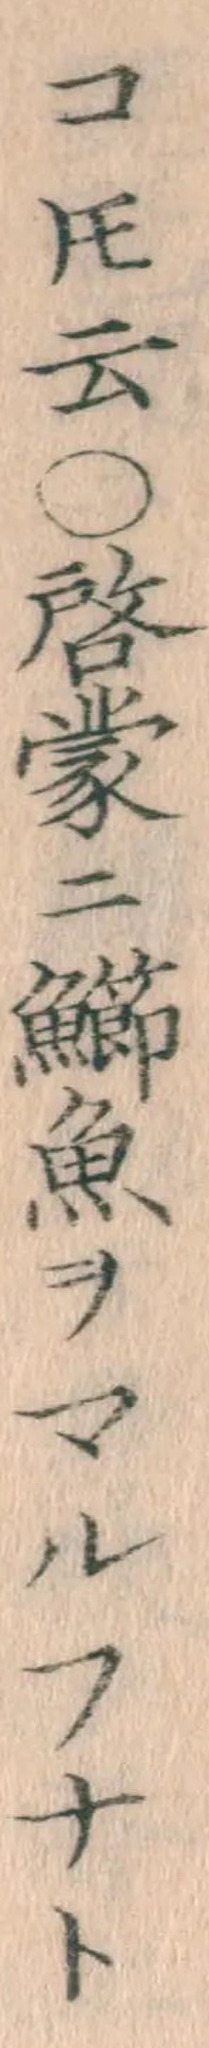コトモ云〇啓蒙ニ䲙魚ヲマルフナト
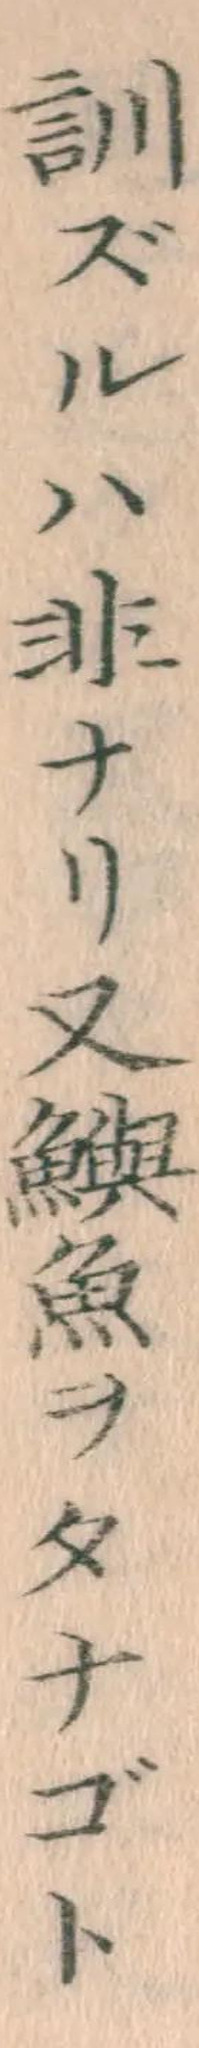訓ズルハ非ナリ鱮魚ヲタナゴト
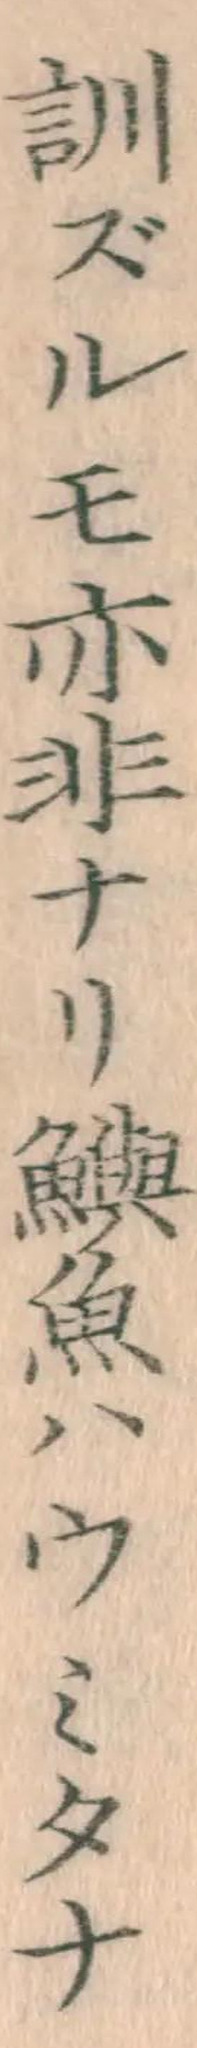訓ズルモ亦非ナリ鱮魚ハウミタナ
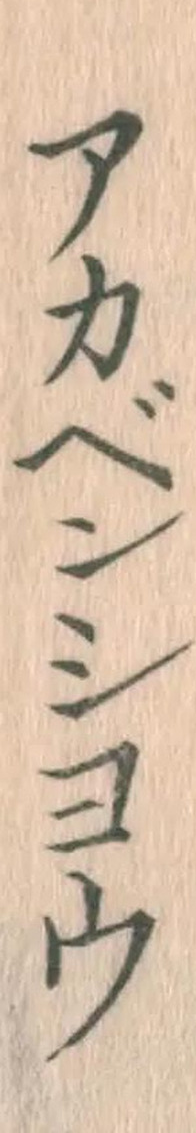アカベンシヨウ
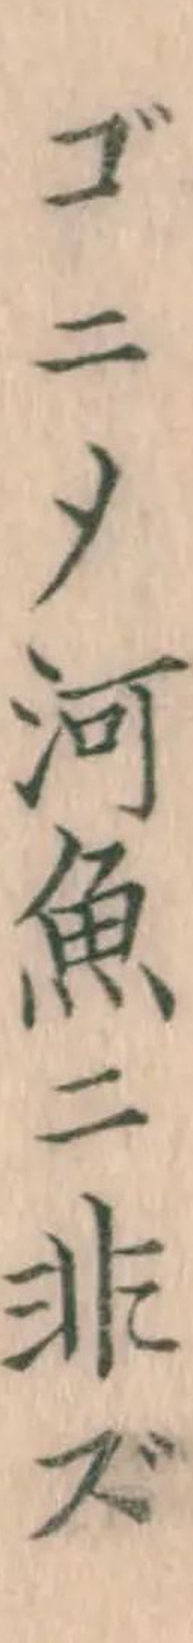ゴニシテ河魚ニ非ズ

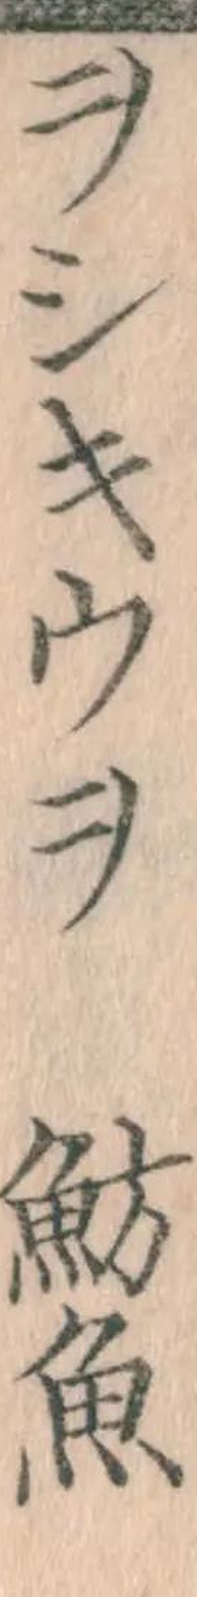ヲシキウヲ魴魚
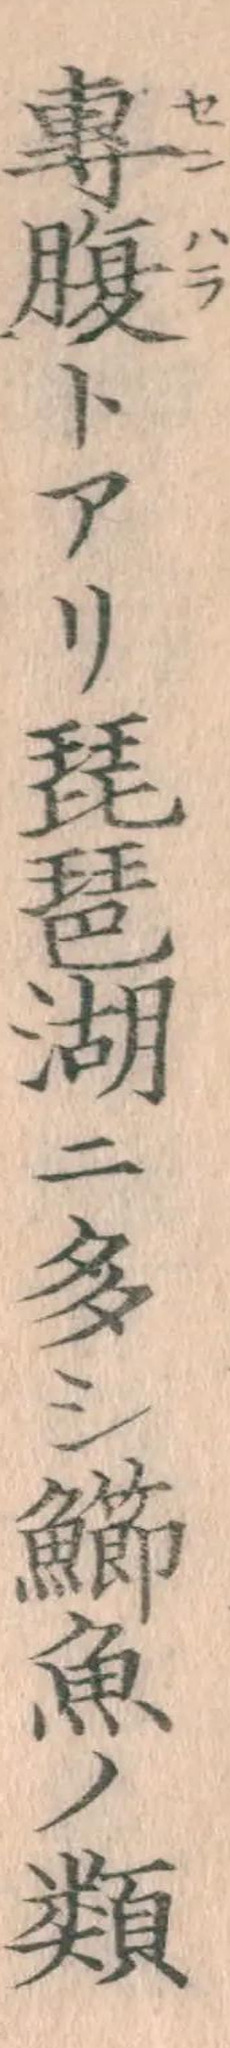専腹トアリ琵琶湖ニ多シ䲙魚ノ類
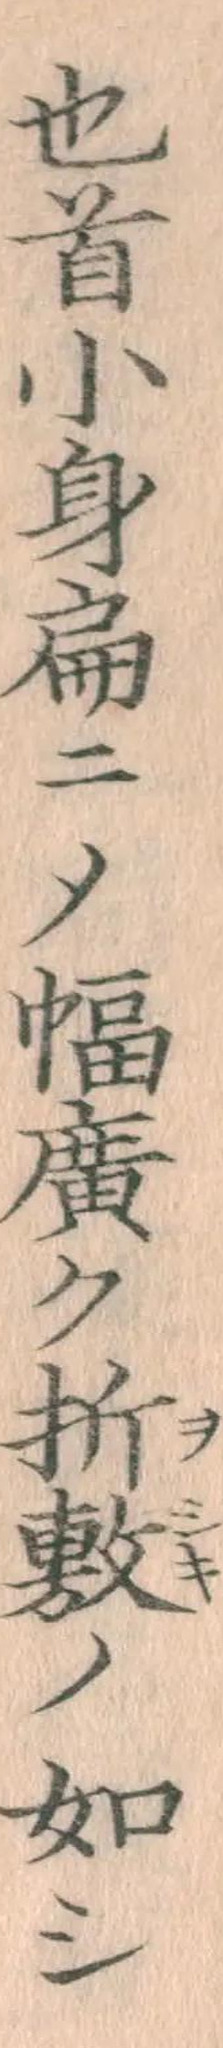也首小身扁ニシテ幅広ク折敷ノ如シ
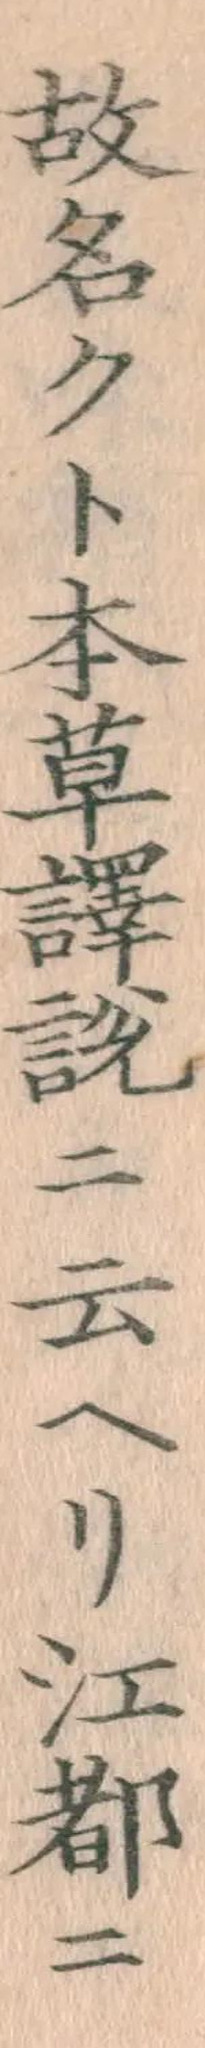故名クト本草訳説ニ云ヘリ江都ニ
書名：皇和魚譜 2巻
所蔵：国立国会図書館 National Diet Library, JAPAN
